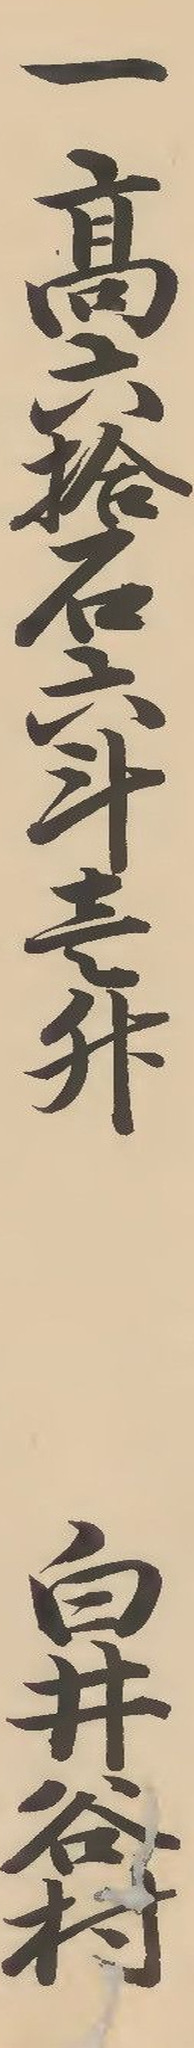一高六拾石六斗壱升白井谷村
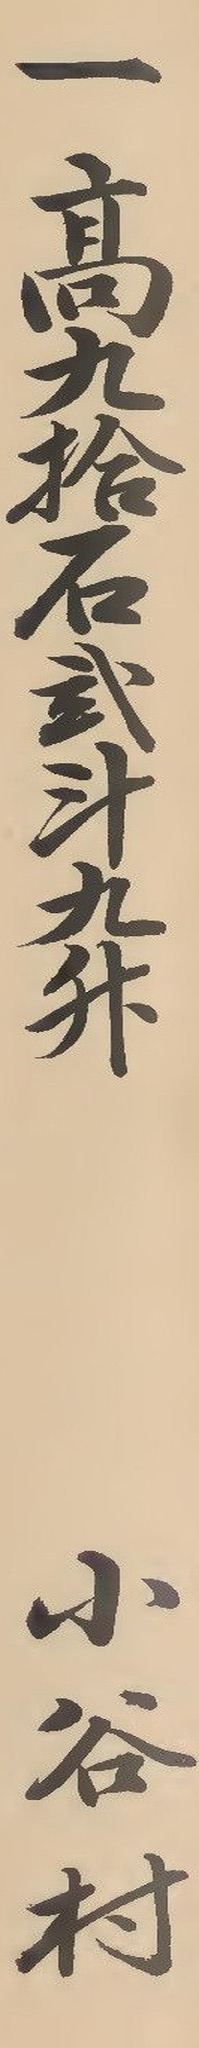一高九拾石弐斗九升小谷村
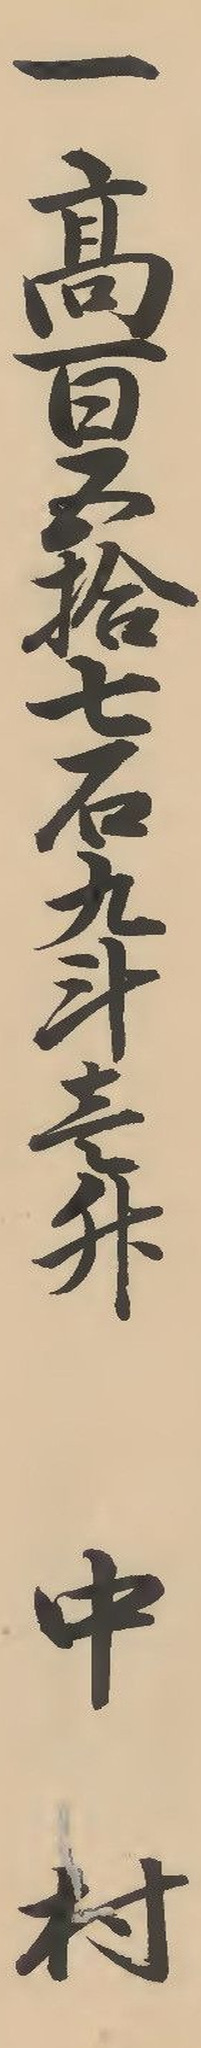一高百五拾七石九斗壱升中村
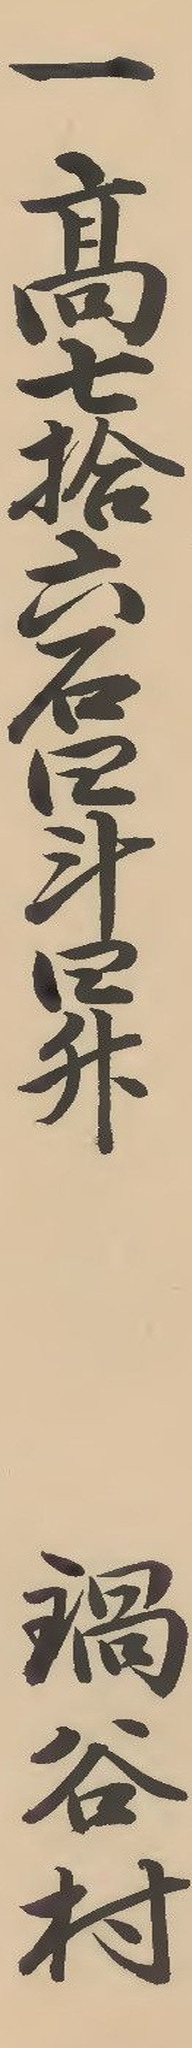一高七拾六石四斗四升鍋谷村
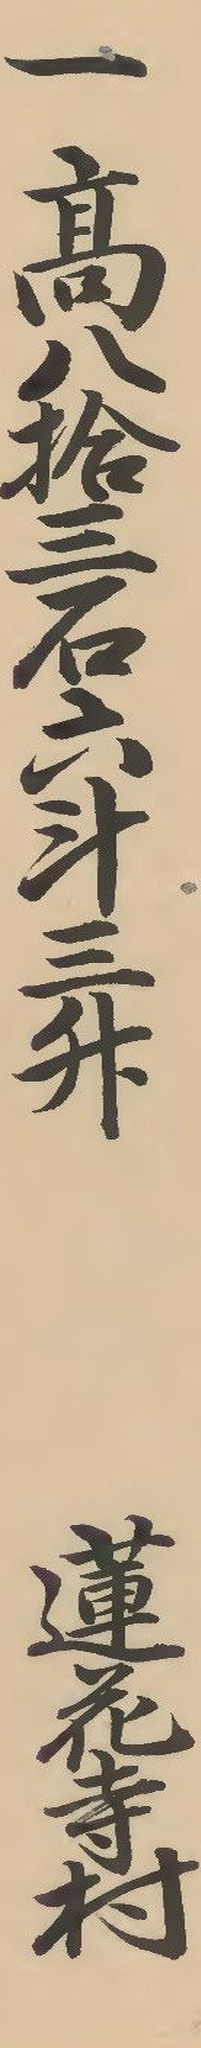一高八拾三石六斗三升蓮花寺村

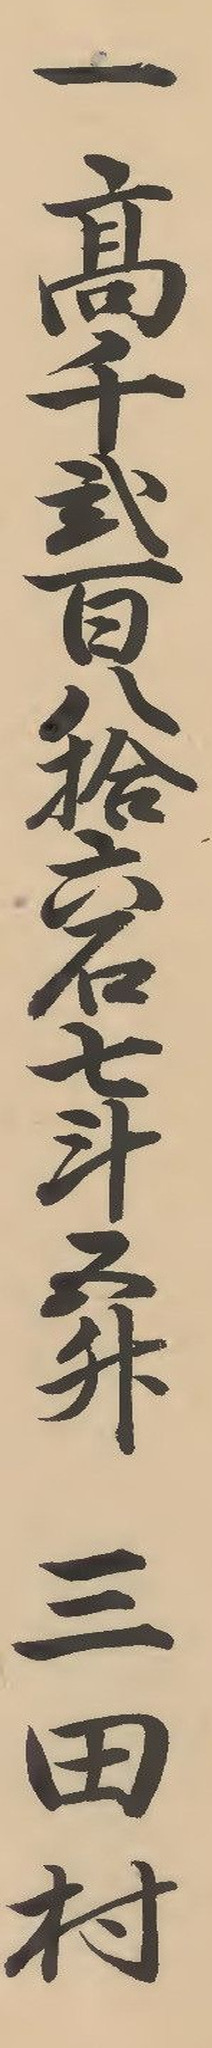一高千弐百八拾六石七斗五升三田村
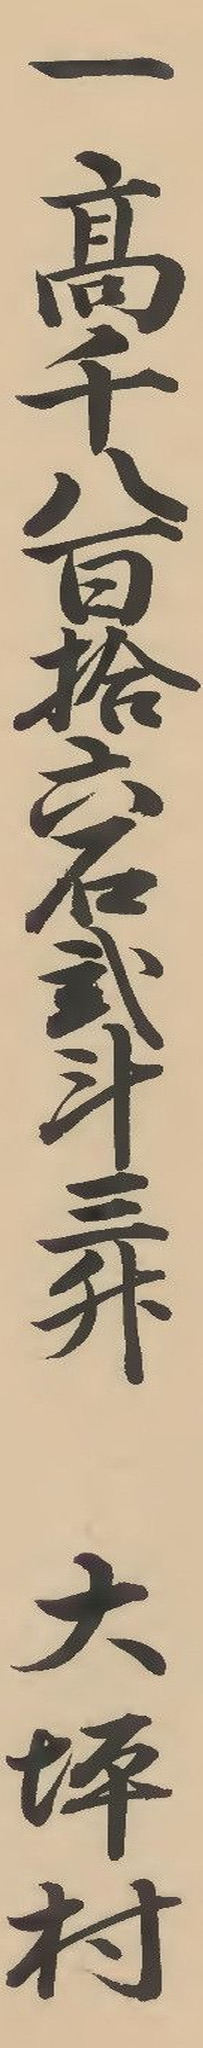一高千八百拾六石弐斗三升大坪村
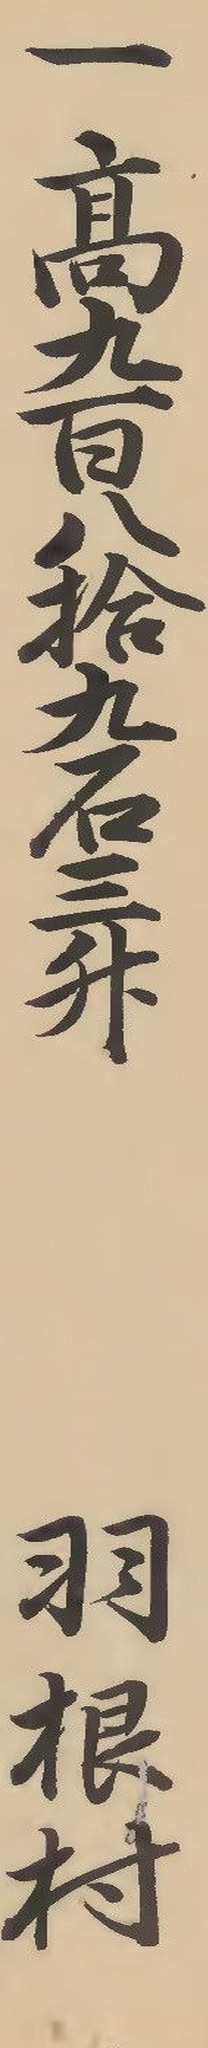一高九百八拾九石三升羽根村
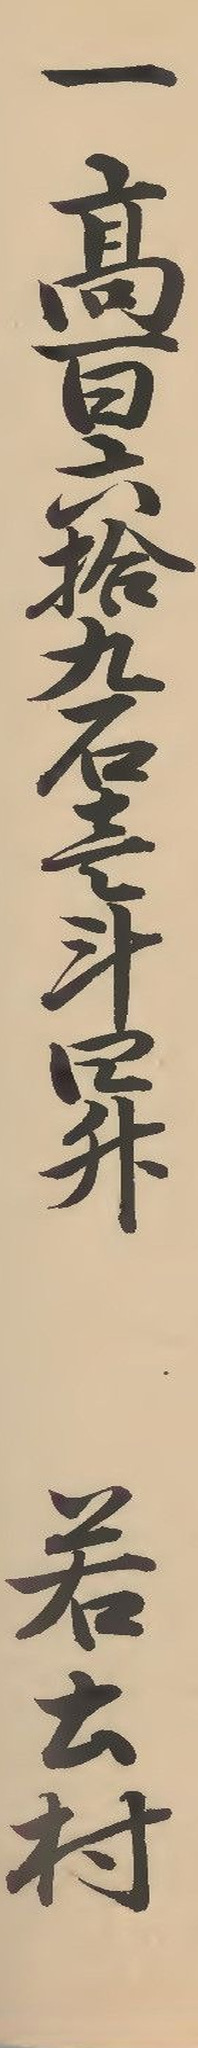一高百六拾九石壱斗四升若土村
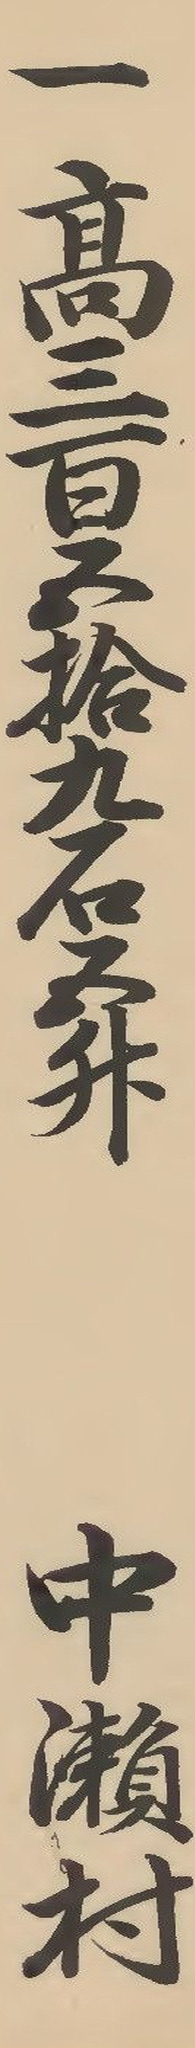一高三百五拾九石五升中瀬村
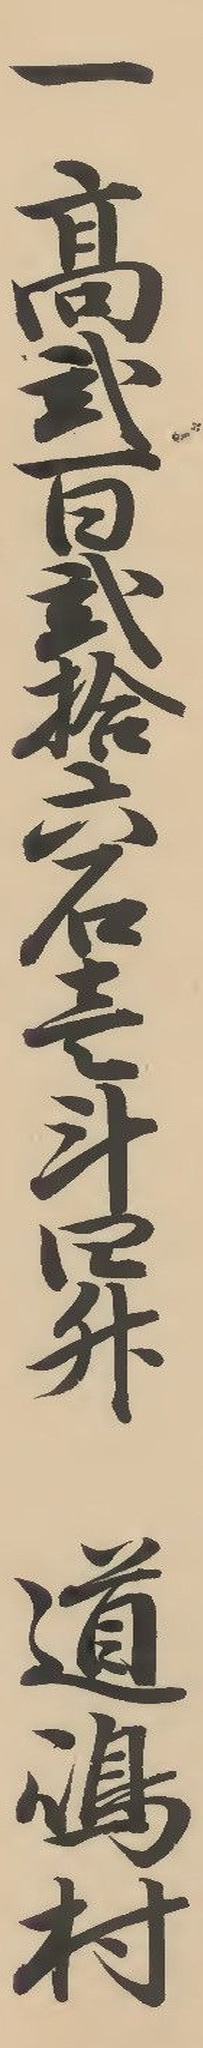一高弐百弐拾六石壱斗四升道島村
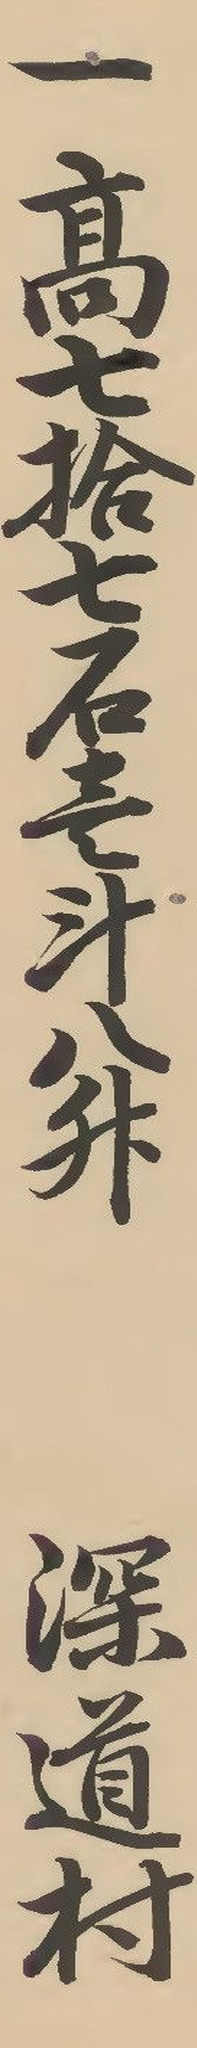一高七拾七石壱斗八升深道村

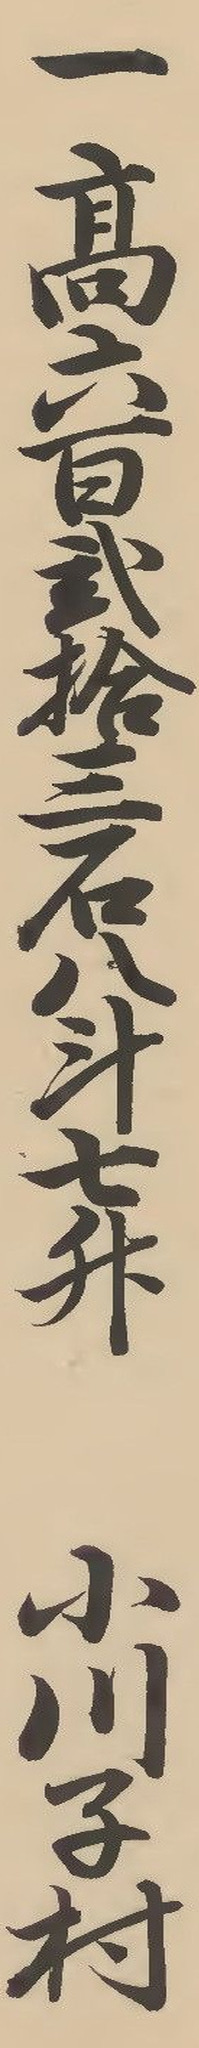一高六百弐拾三石八斗七升小川子村
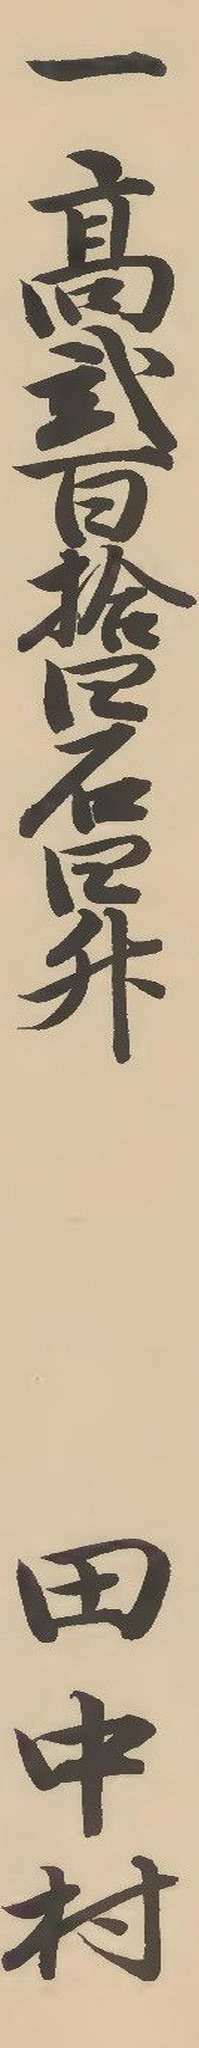一高弐百拾四石四升田中村
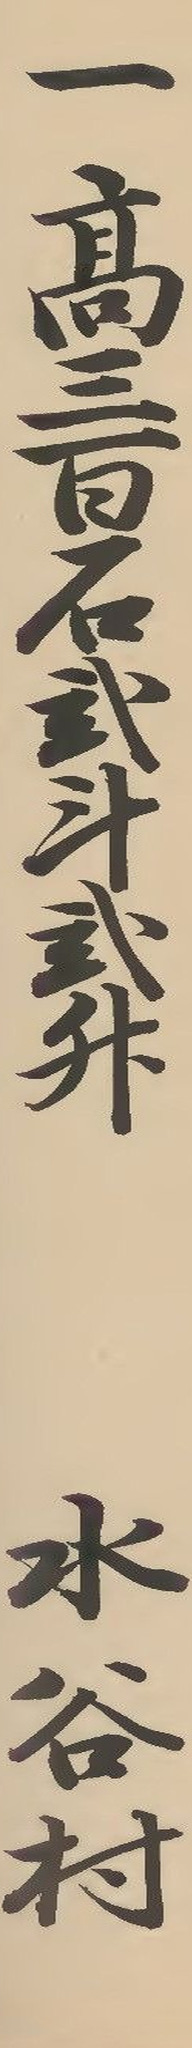一高三百石弐斗弐升水谷村
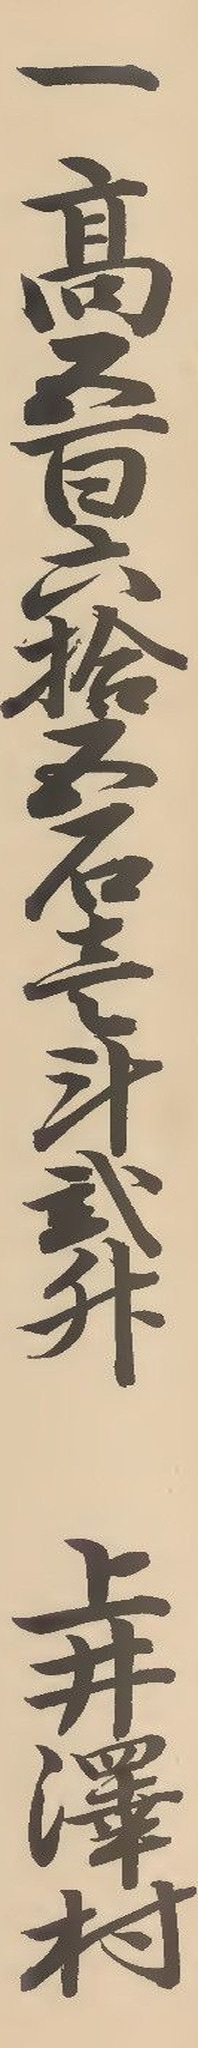一高五百六拾五石壱斗弐升上井沢村
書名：越中国郷帳
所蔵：国立公文書館 National Archives of Japan
